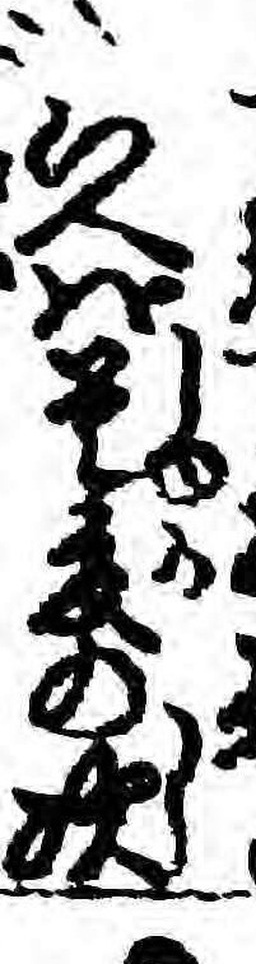いへば首夏の次
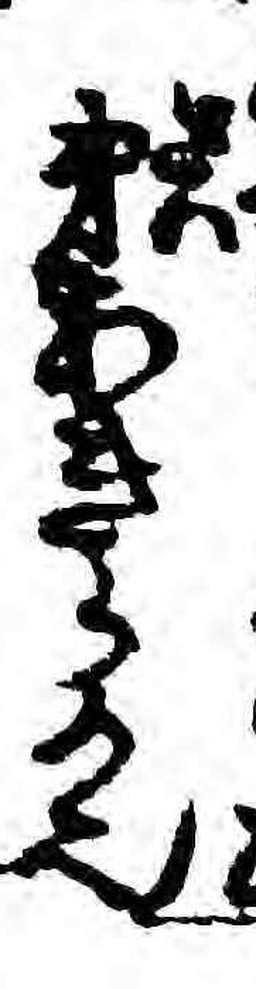第あきらか也
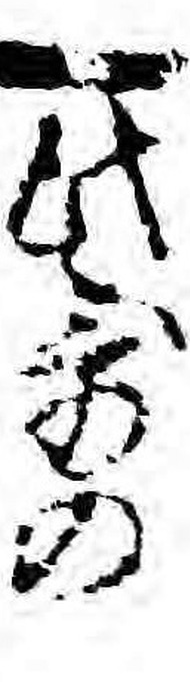此哥の
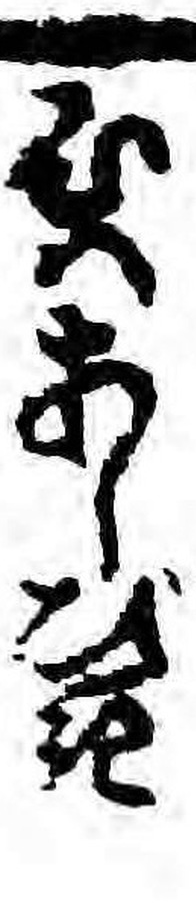心はあしびき
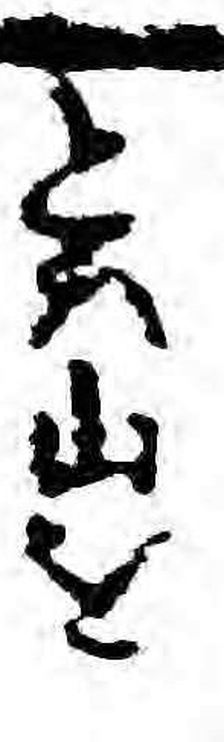とは山を
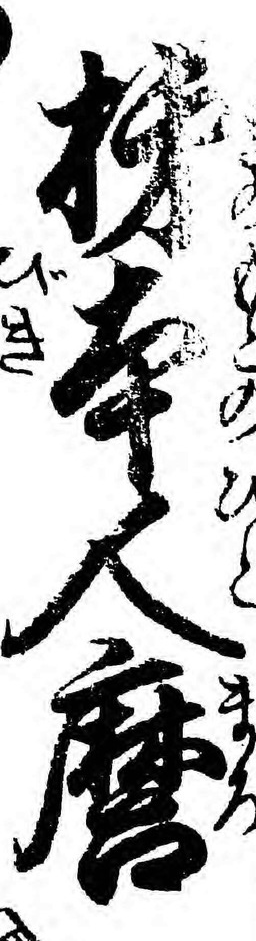柿本人麿
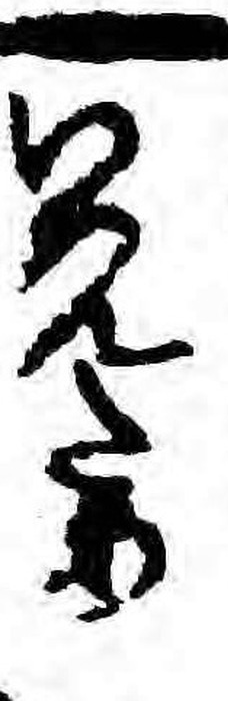いはんため
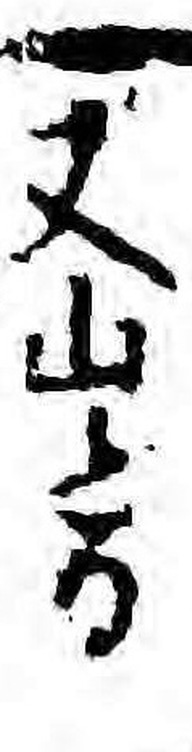又山とり
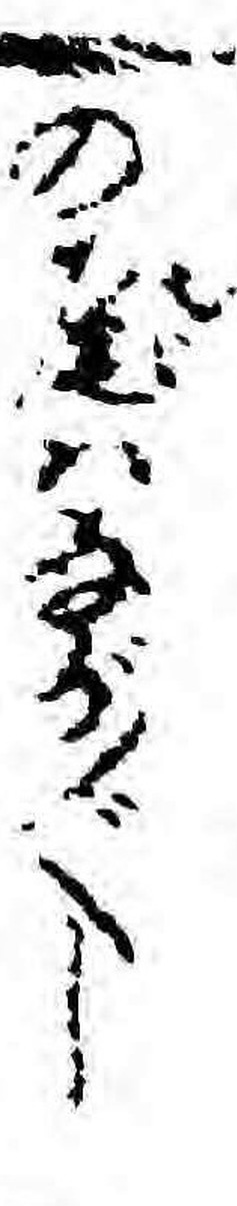の尾はなが〴〵し
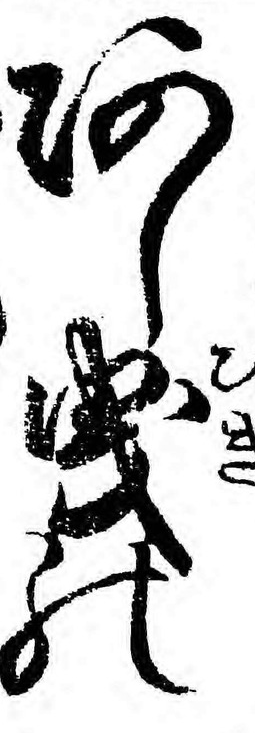あし曳の
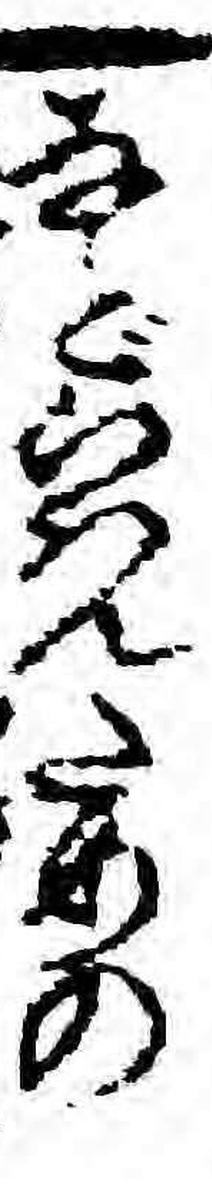などいはんための
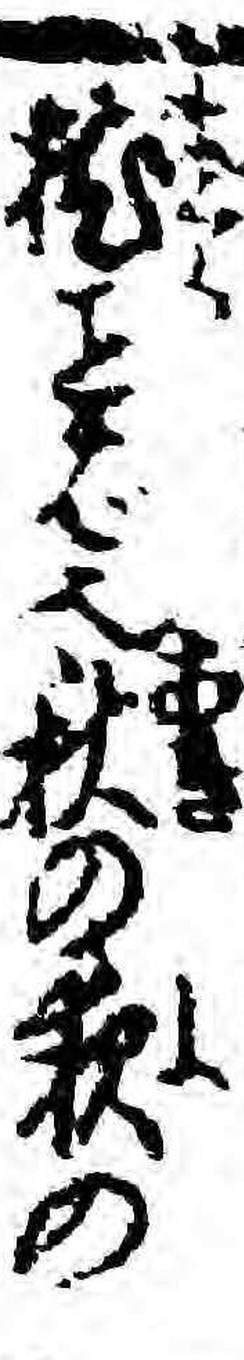枕ことば也秋の夜の
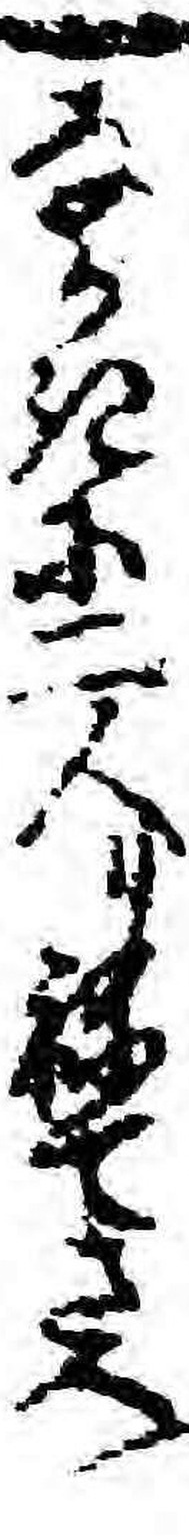なかきに二人りねてさへ
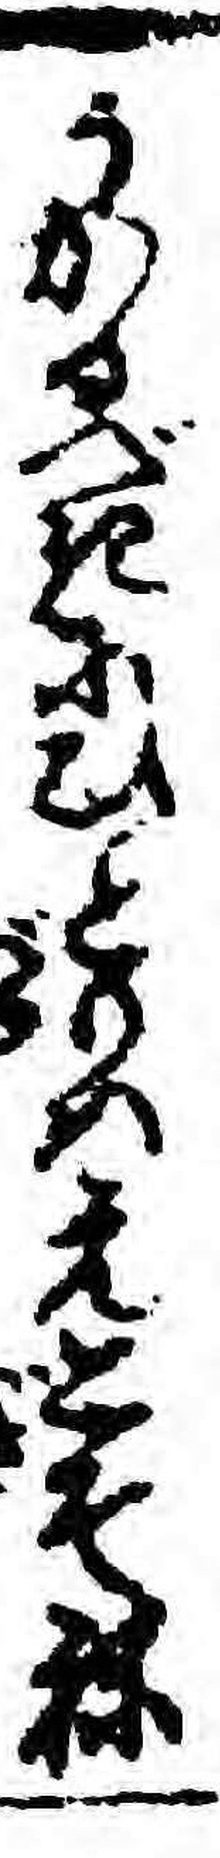うかるべきにひとりはえこそね
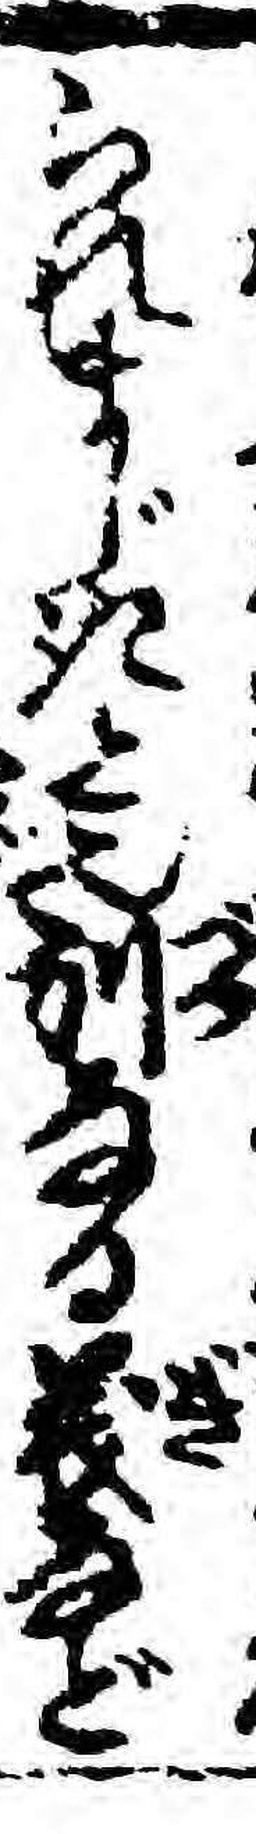られまじきと也別なる義など
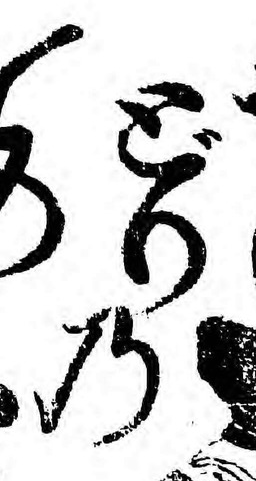どりの
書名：頭書和歌注譯／壽賀多百人一首小倉錦
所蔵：国文学研究資料館
